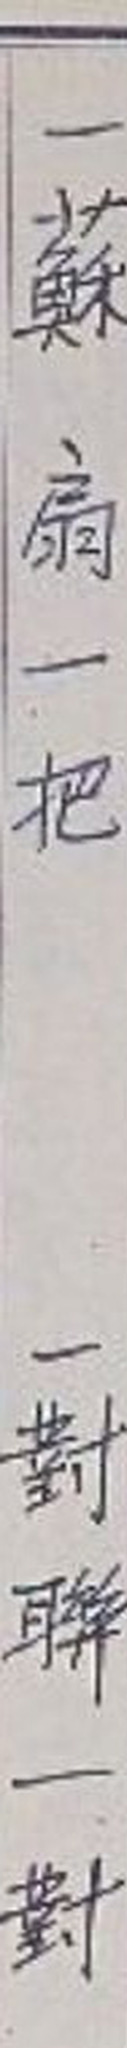一蘇扇一把一対聯一対
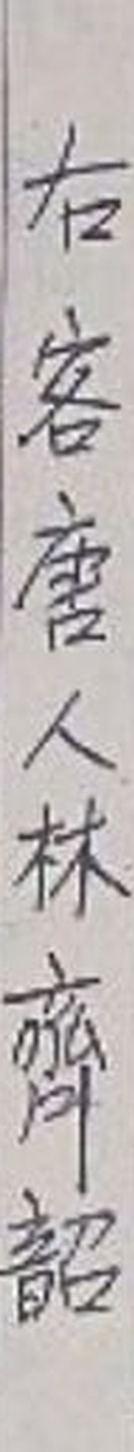右客唐人林齊韶
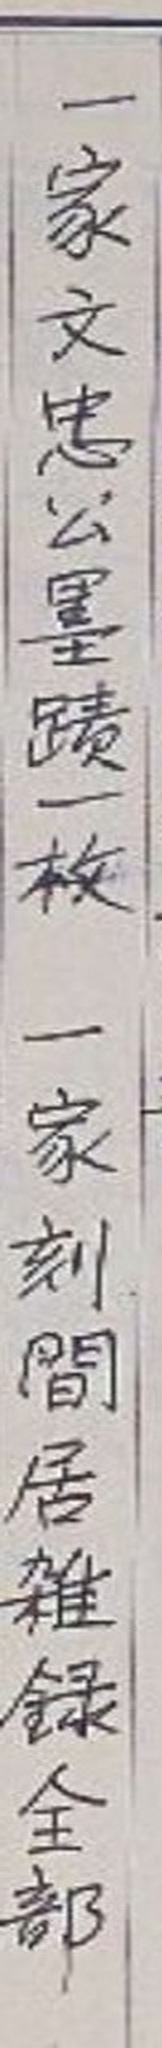一家文忠公墨蹟一枚一家刻間居雑録全部
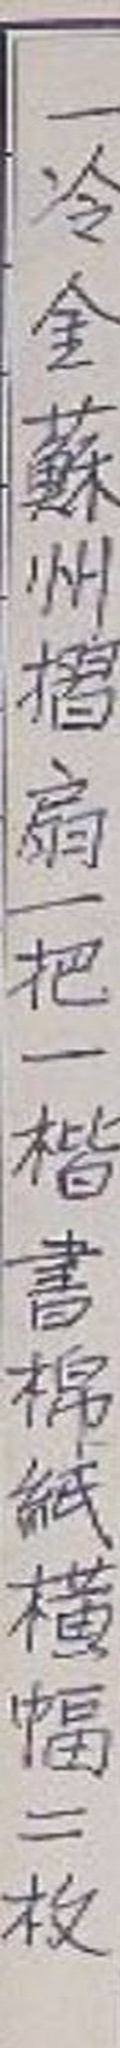一冷金蘇州摺扇一把一楷書棉紙横幅二枚
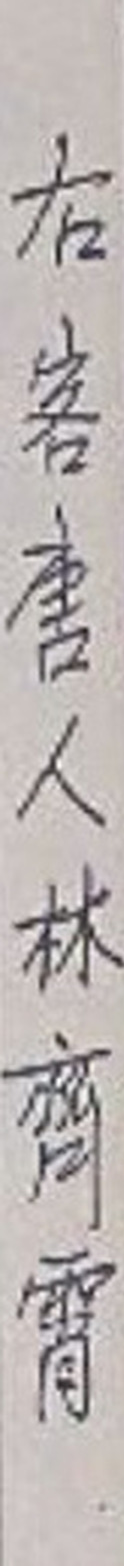右客唐人林齊霄
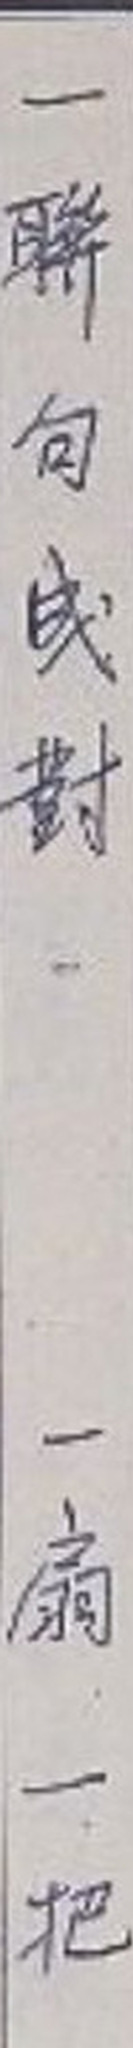一聯句成対一扇一把
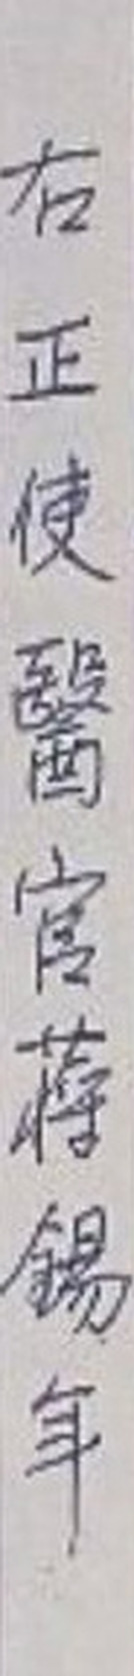右正使医官䉃錫年
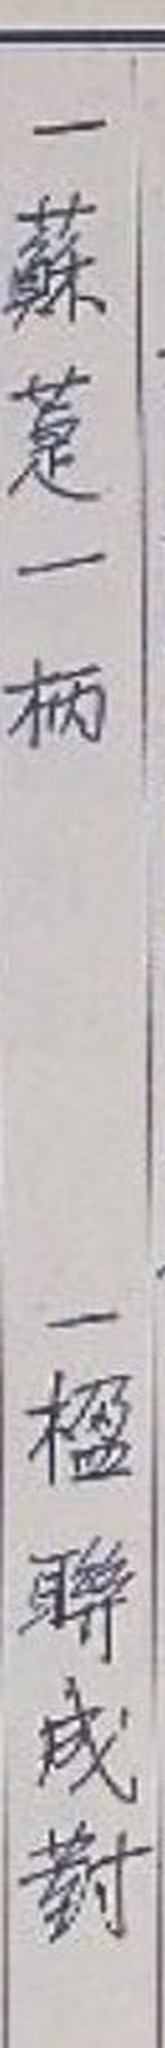一蘇箑一柄一楹聯成対
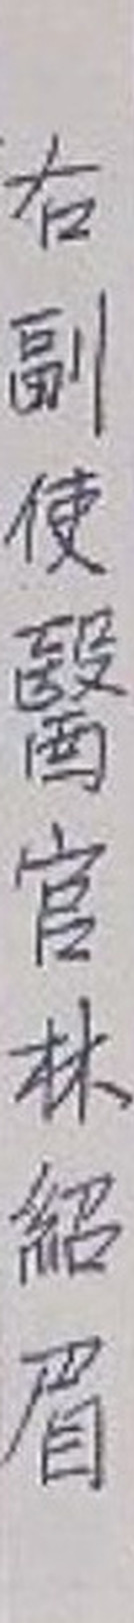右副使医官林紹眉
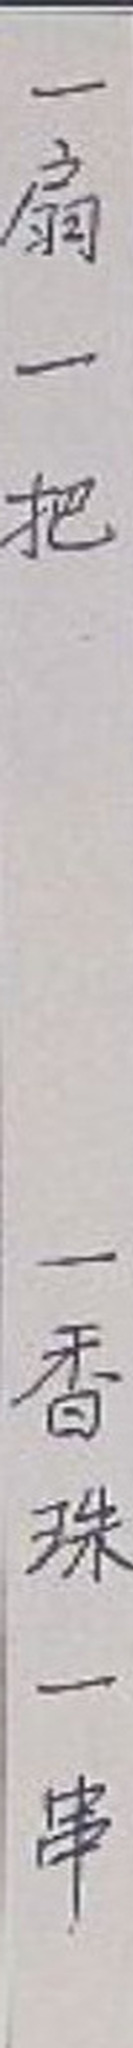一扇一把一香珠一串
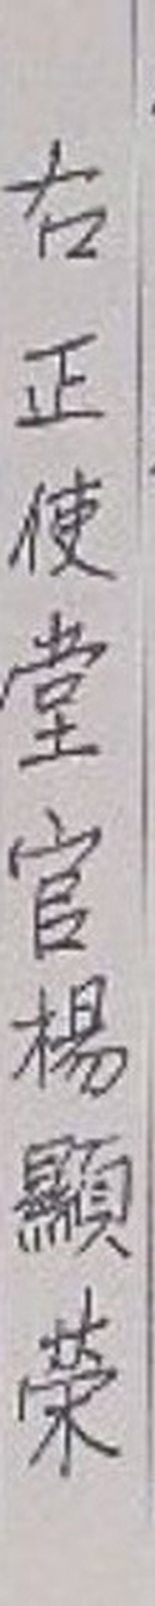右正使堂官楊顕栄
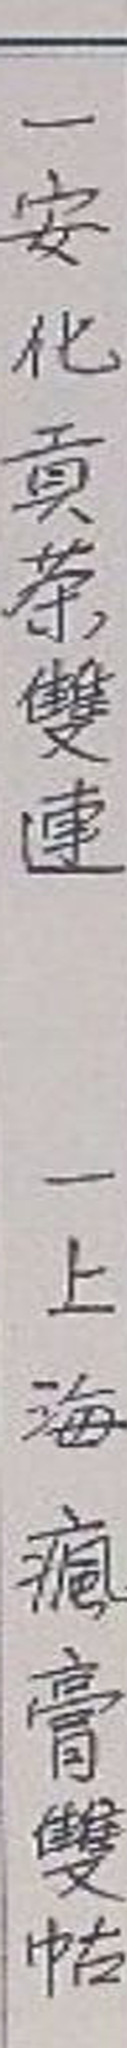一安化貢茶雙連一上海瘋膏雙帖

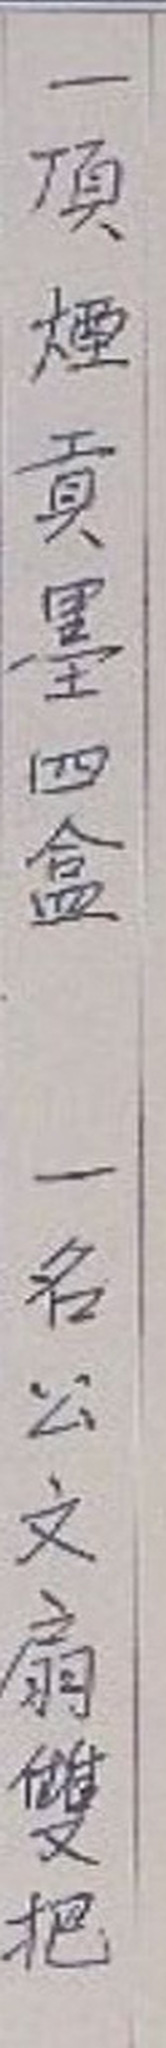一頂煙貢墨四盒一名公文扇雙把
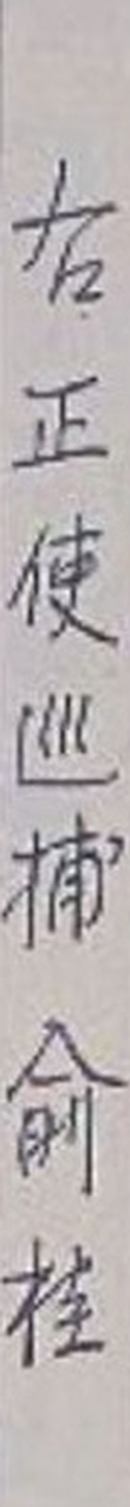右正使巡捕兪桂
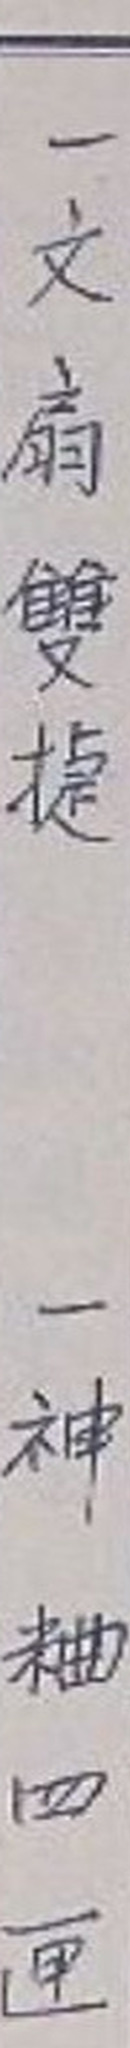一文扇雙捷一神粬四匣
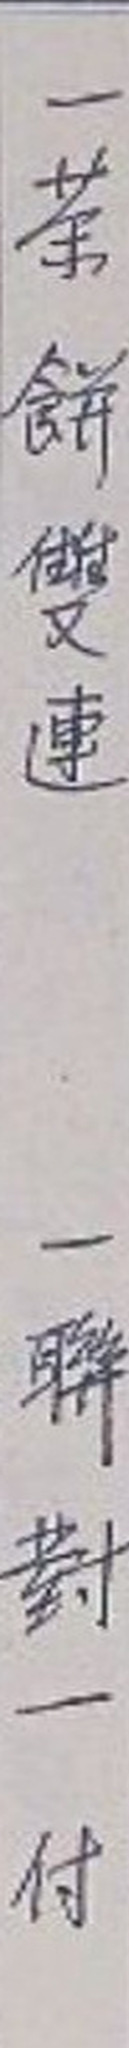一茶餅雙連一聯対一付
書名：支那冊封使来琉諸記 下巻
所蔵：University of the Ryukyus Library
